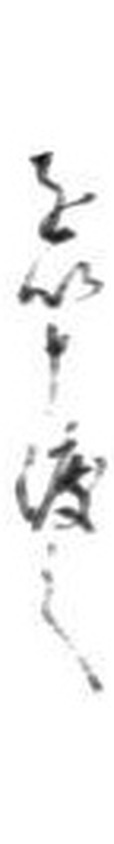を以申渡之
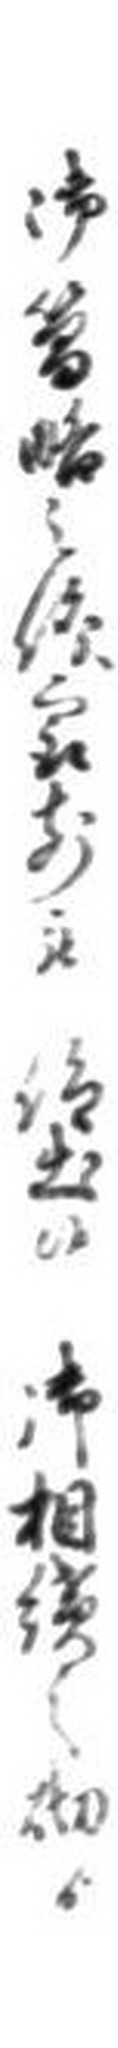御簡略之儀最前被仰出候御相続之砌ゟ
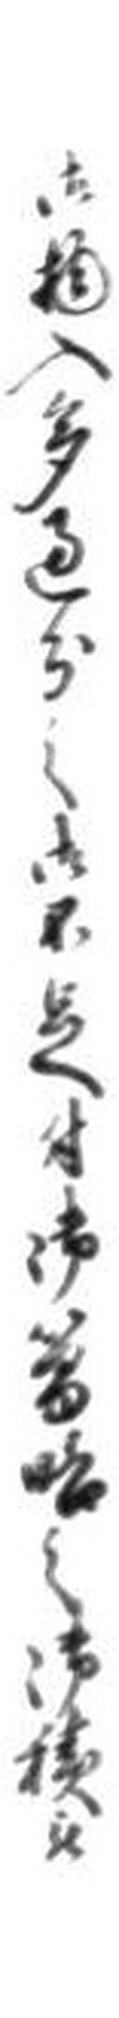御物入多過分之御不足付御簡略之御積被
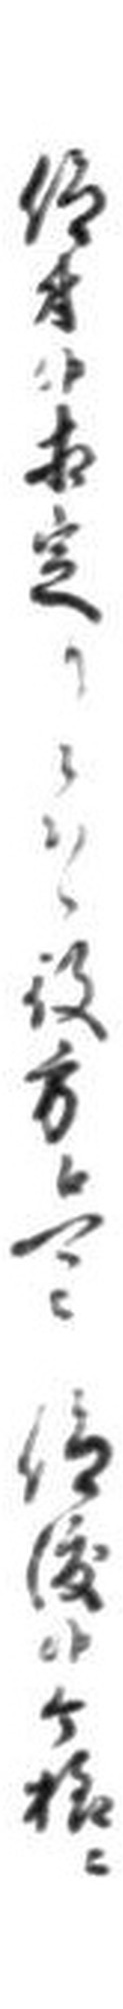仰付候相定り候ハヽ役方江可被仰渡候ケ様ニ
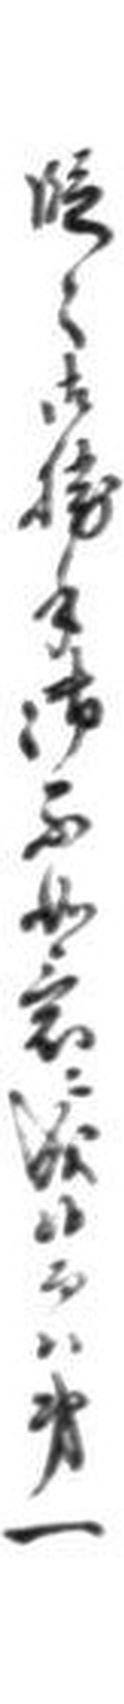段々御勝手御不如意ニ成候而ハ第一

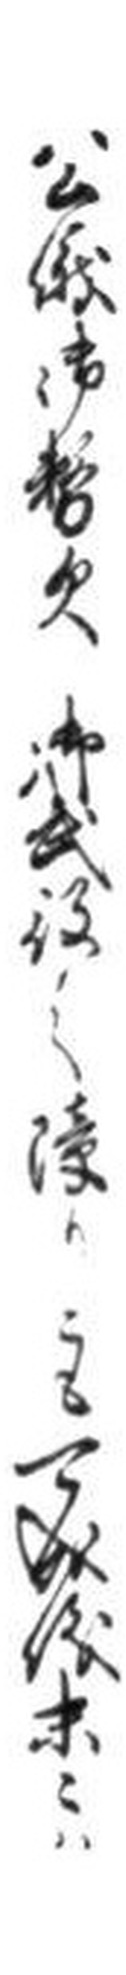公儀御務欠御武役之障りニも可成儀末々ハ
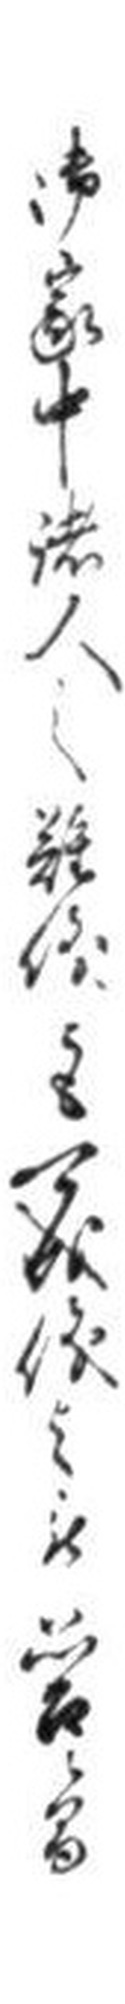御家中諸人之難儀ニも可成儀与被思召候間
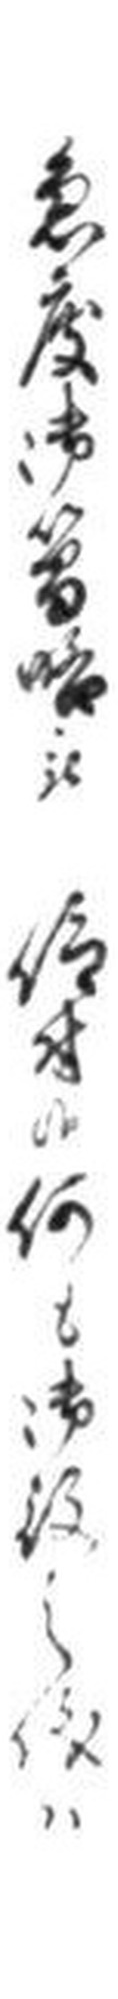急度御簡略被仰付候何も御役之儀ハ
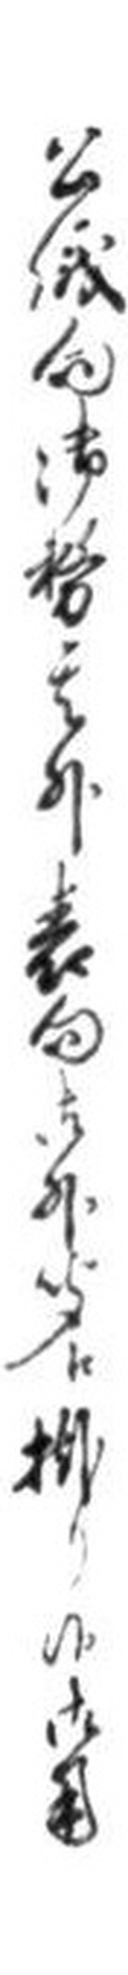公儀向御務其外表向御外聞江掛り候御用
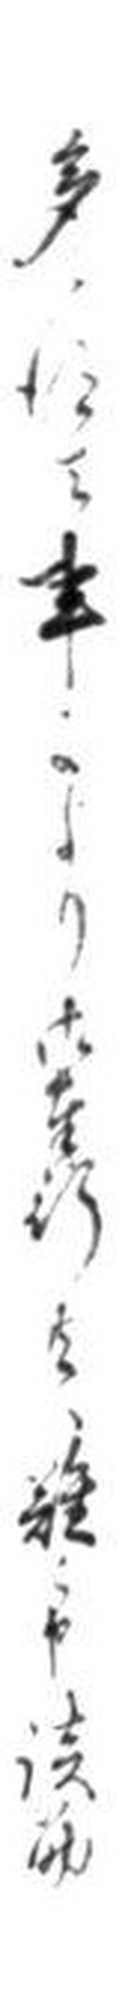多候得者事により御奉行共へ難被申談筋
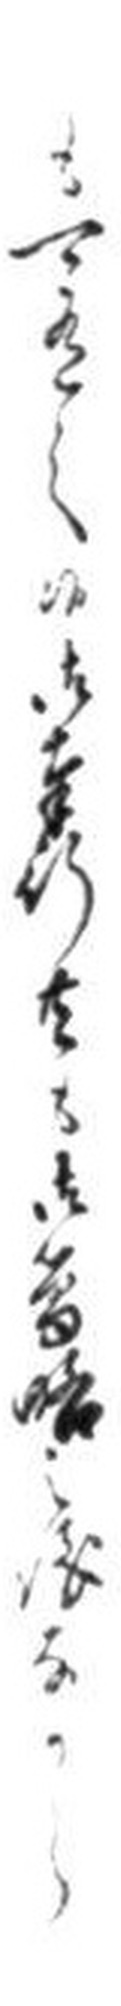も可有之候御奉行共も御簡略之儀なから
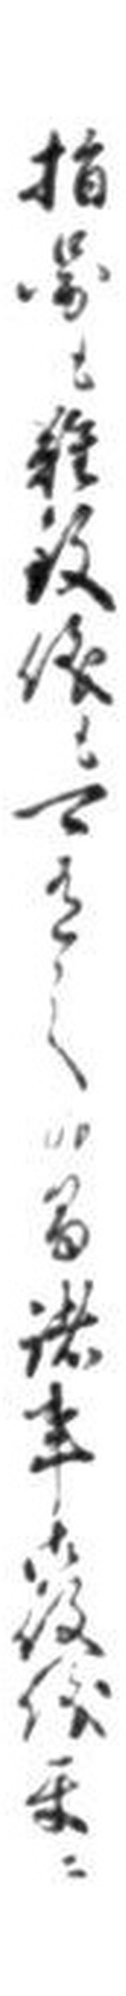指図も難致儀も可有之候間諸事御役儀互ニ
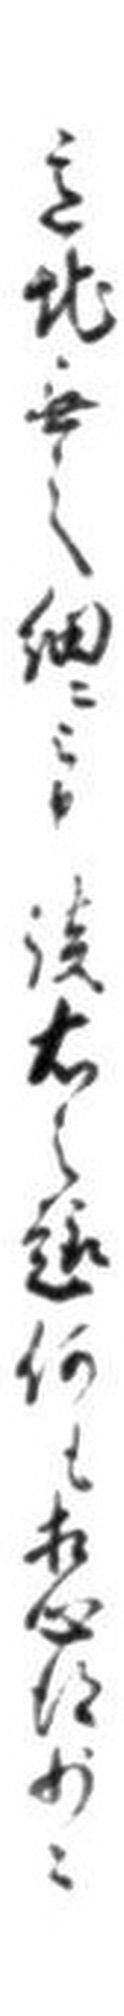意地無之細ニ被申談右之趣何も相心得少々
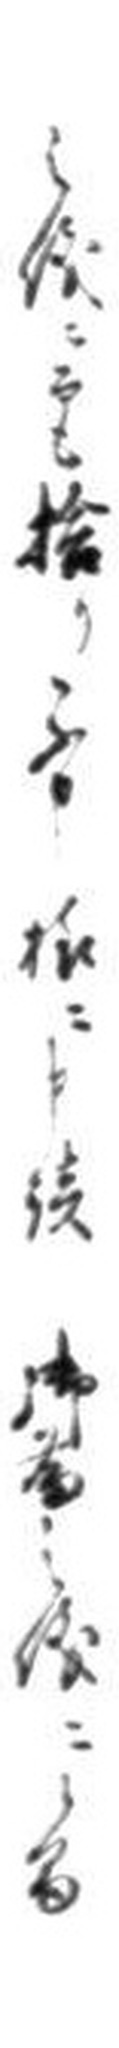之儀ニ而も捨り不申様ニ申談御為之儀ニ候間
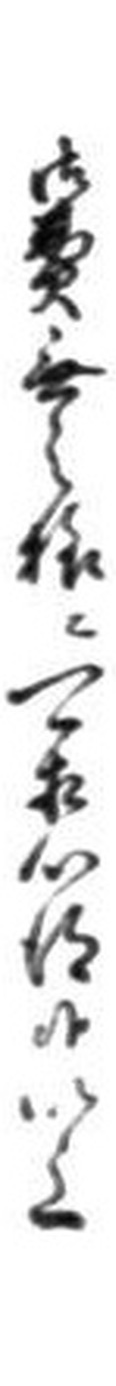御費無之様ニ可相心得候以上
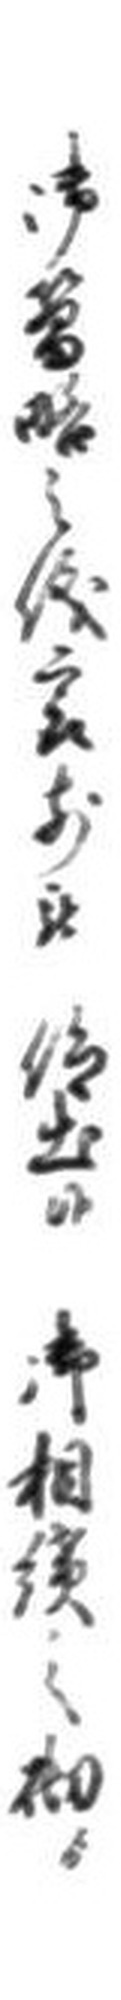御簡略之儀最前被仰出候御相続之砌ゟ
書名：家譜 三十六 宗昌公 従享保八年到同九年
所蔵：福井県文書館 Fukui Prefectural Archives
